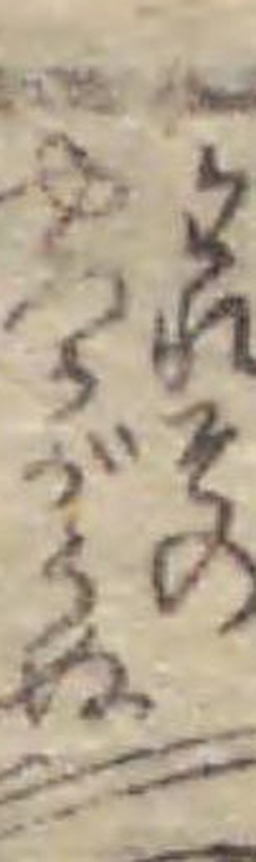やろうがうぬ
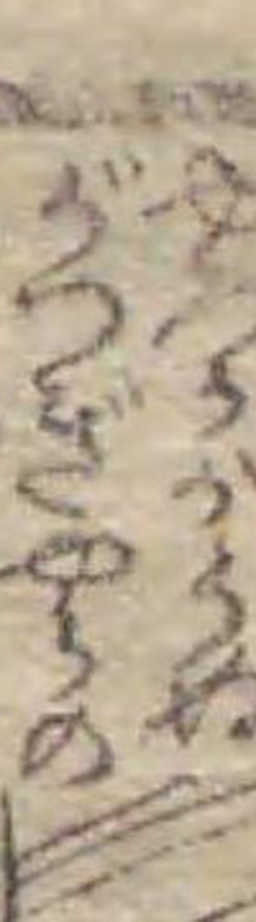がつぎやうの
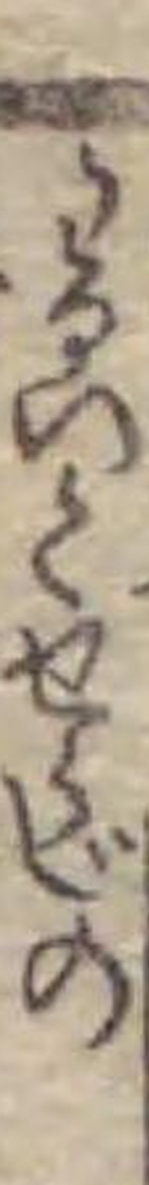わるいとせうじの
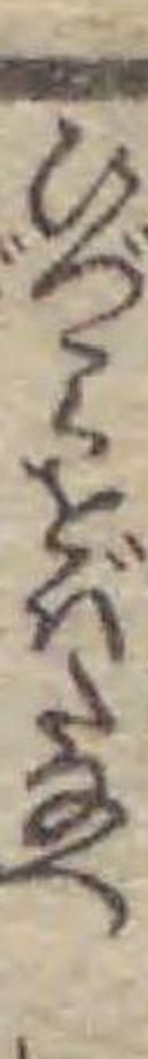ひづみをばたなへ
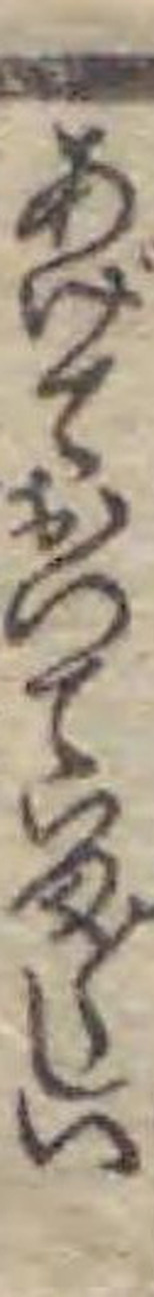あげておつていま〳〵しい
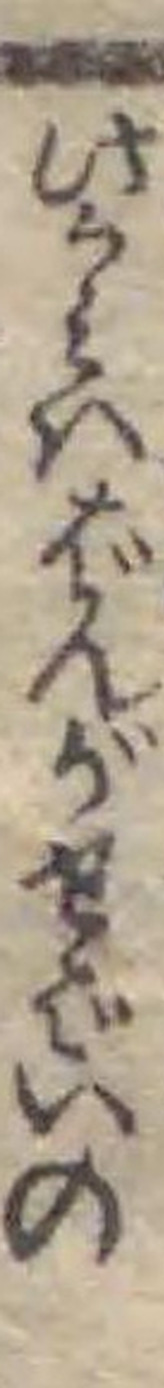此かみはばんがせばいの
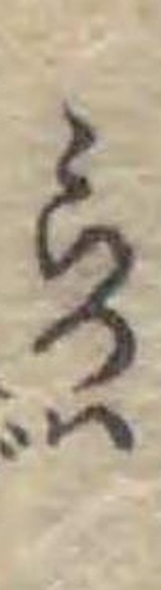こいつは
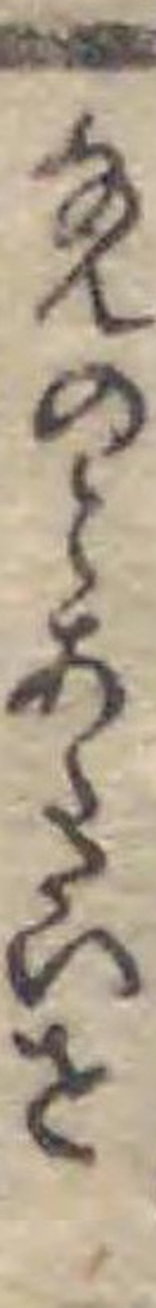なんのとあくたいを
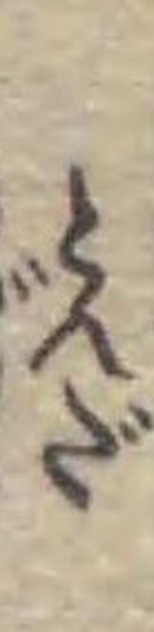とんだ
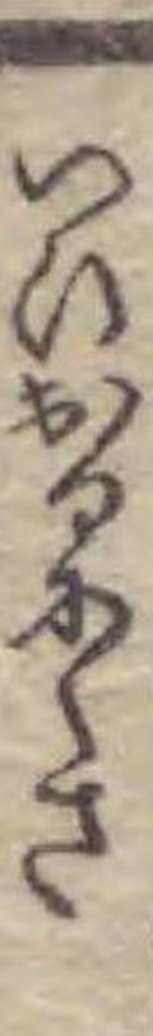いひおるにくさ
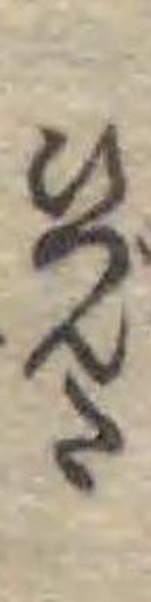ひづんた
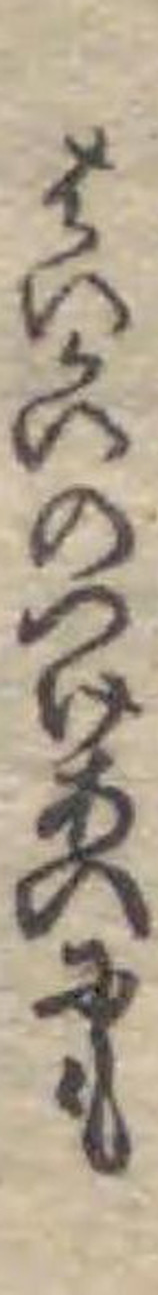はいかいのつけあいにも
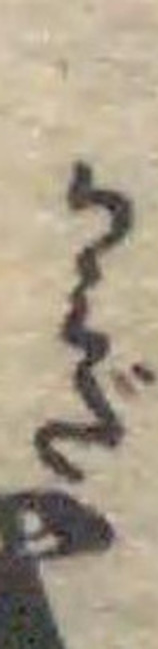かみだ
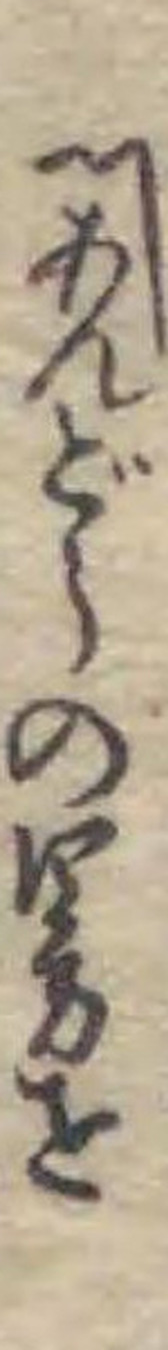〽あんどうの四方を
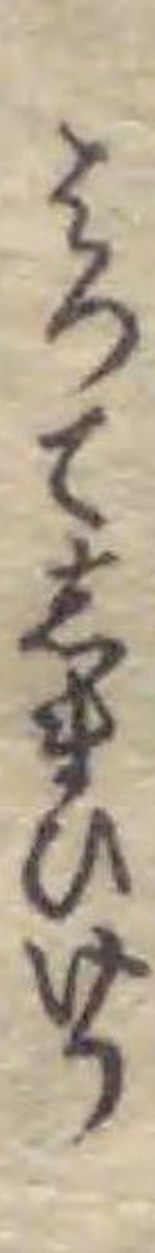はつてしまひけり
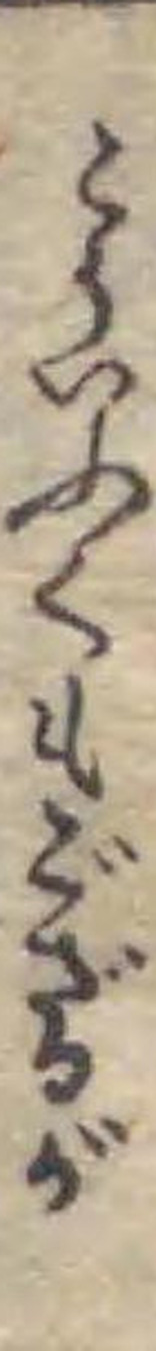こういふくもござるが
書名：紙屑身上噺 : 3巻
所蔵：国立国会図書館 National Diet Library, JAPAN
